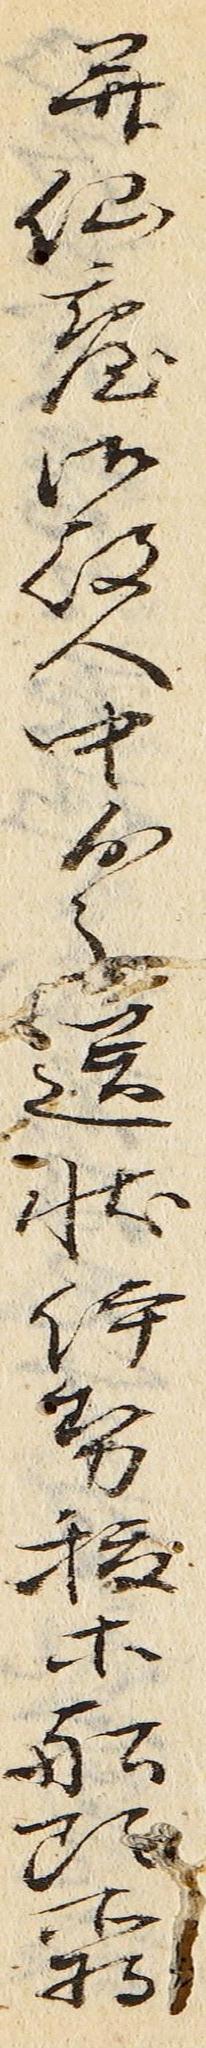并仙台御役人中ゟ之送状伊勢祓等船頭所持
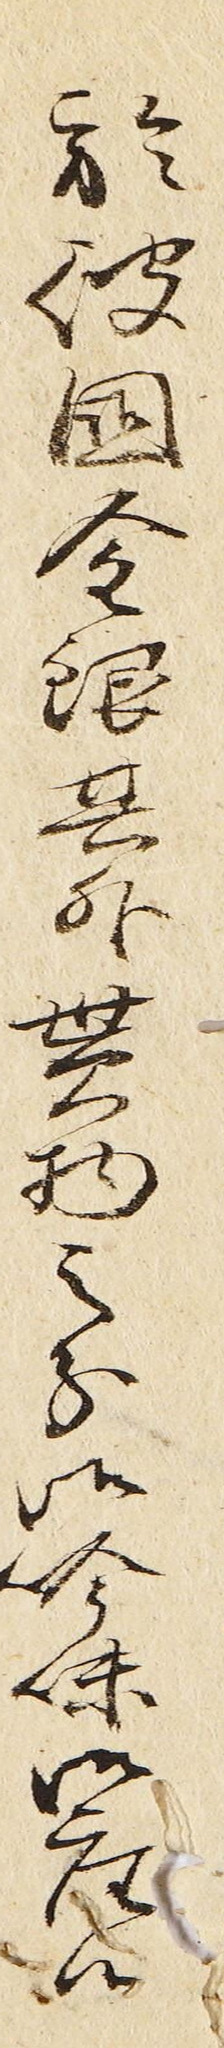一於彼国金銀其外貰物之分御吟味御座候
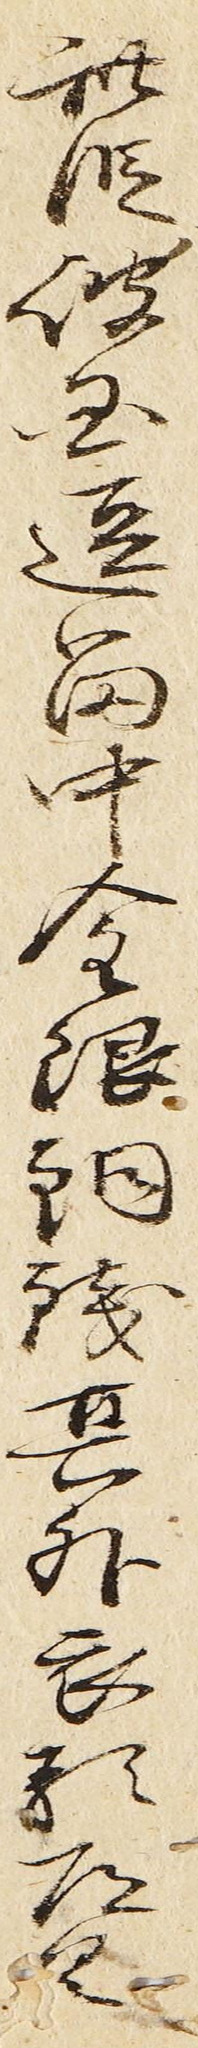此段彼国逗留中金銀銅銭其外衣類道具
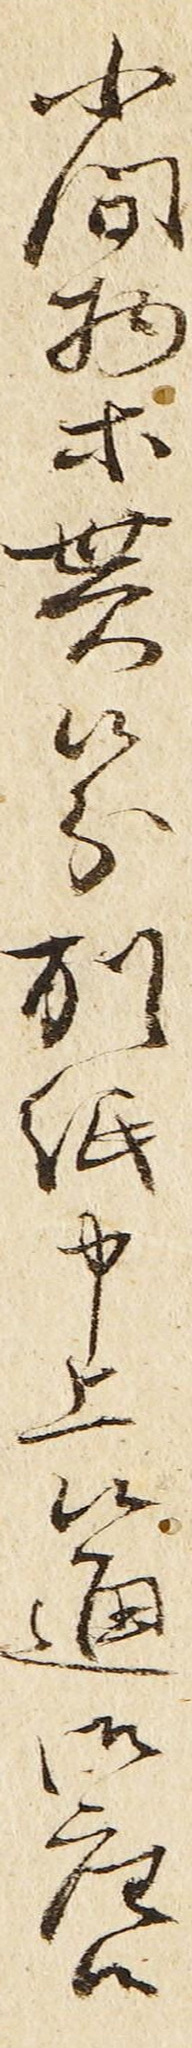小間物等貰候分別紙申上候通御座候
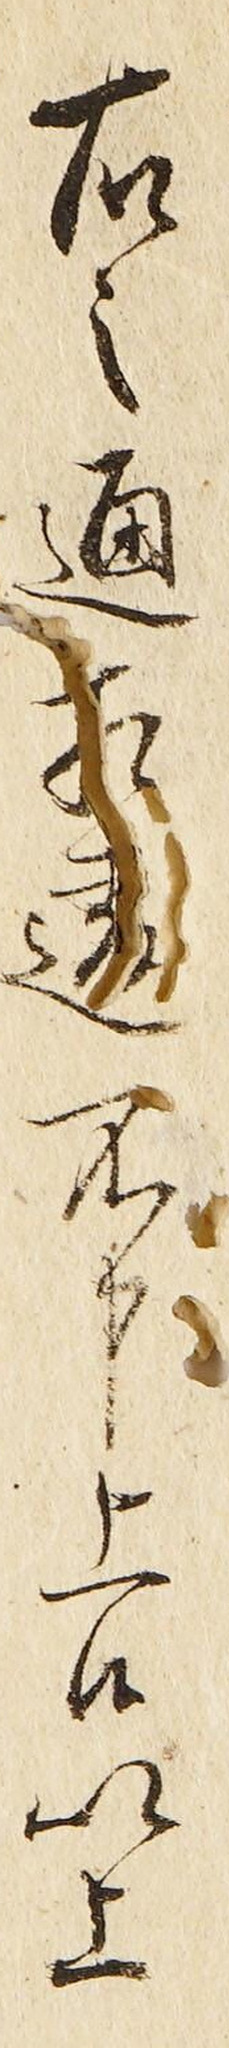右之通相違不申上候以上
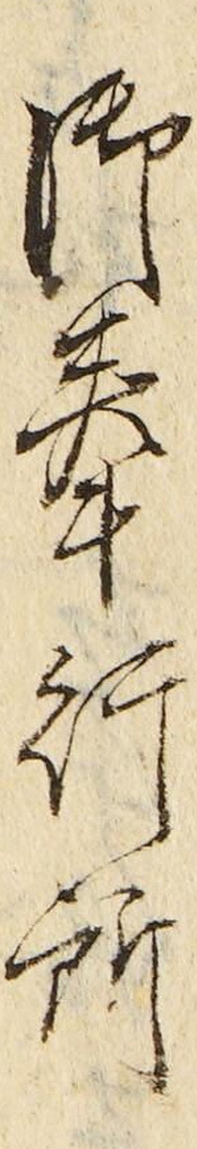御奉行所

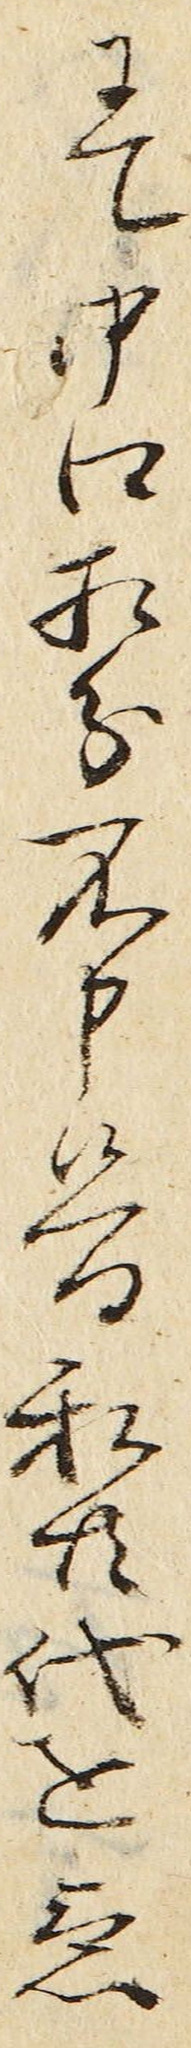にて申口相分不申候間私共代を急
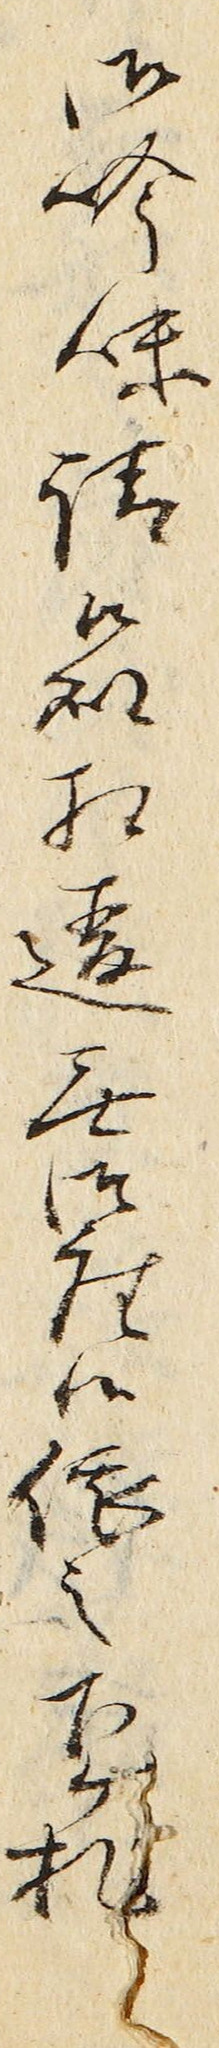御吟味請候処相違無御座候依之下ヶ札
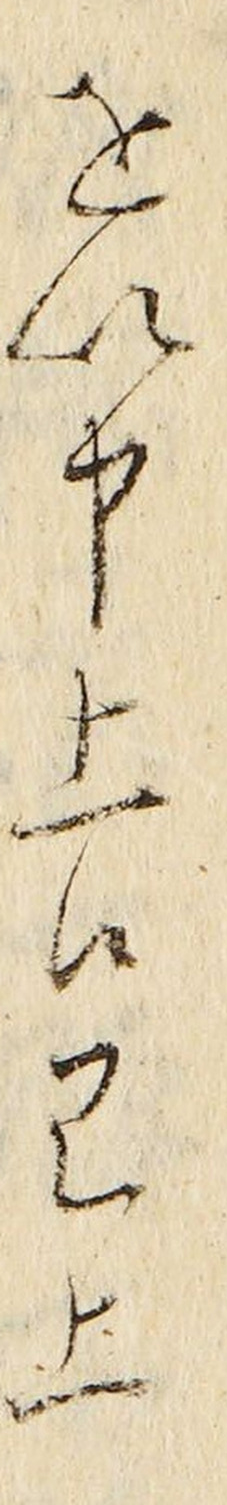を以申上候已上
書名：漂民後記
